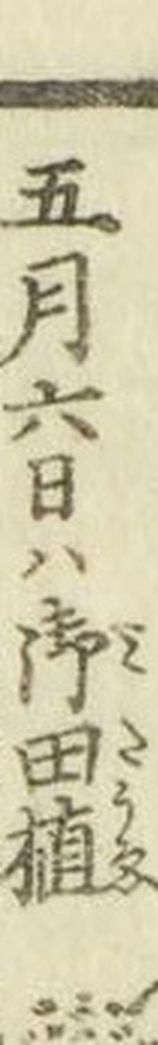五月六日は御田植
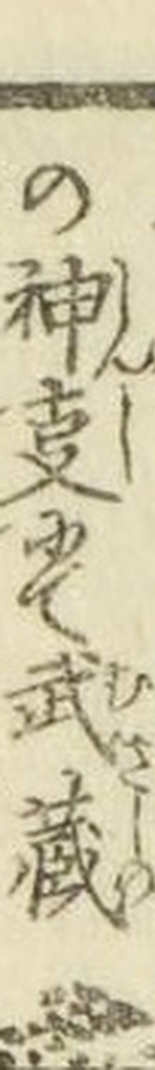の神事にて武蔵
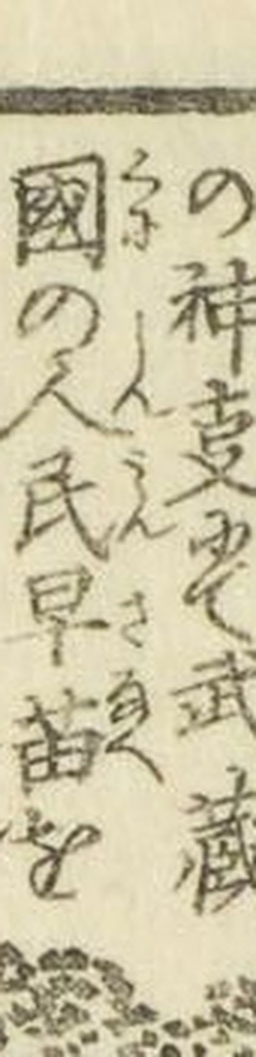国の人民早苗を
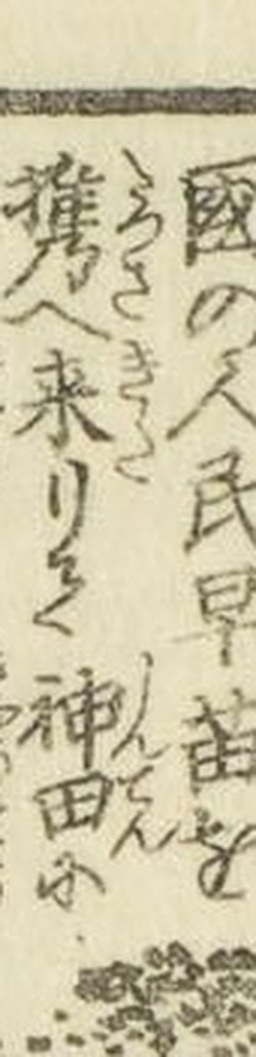携へ来りて神田に
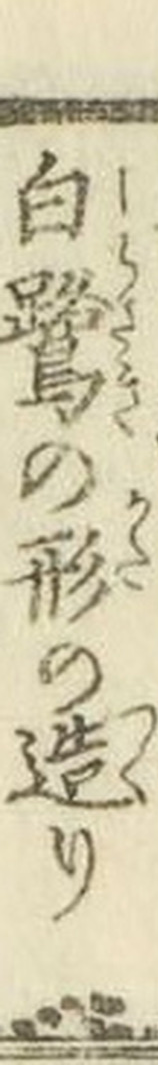白鷺の形の造り
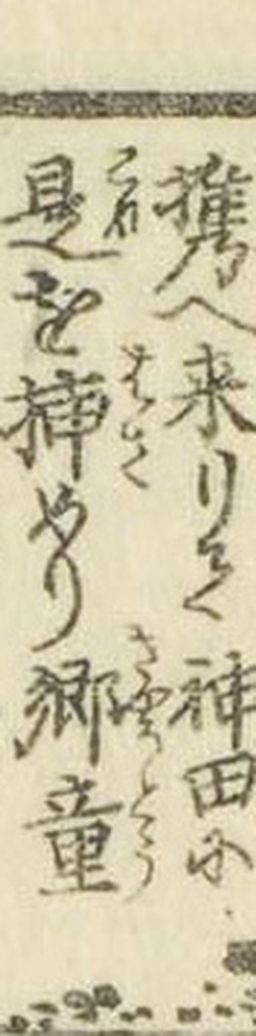是を挿めり郷童
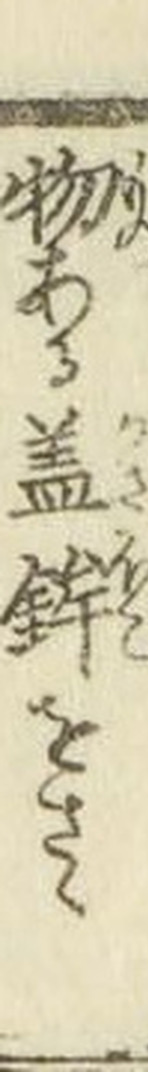物ある盖鉾をさゝ
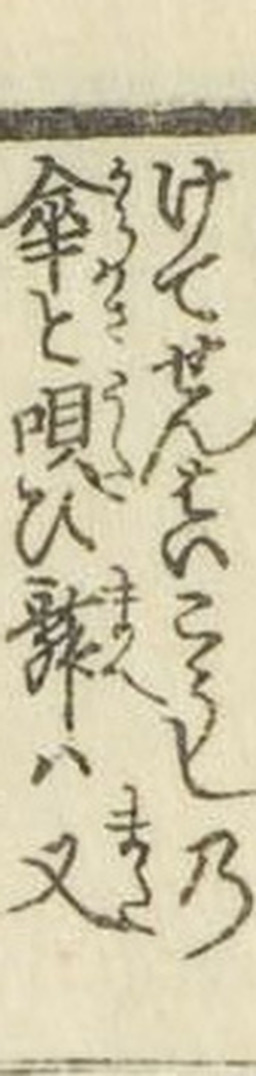傘と唄ひ舞は又
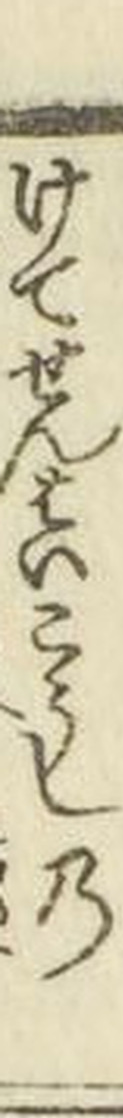けてせんはいこうしの
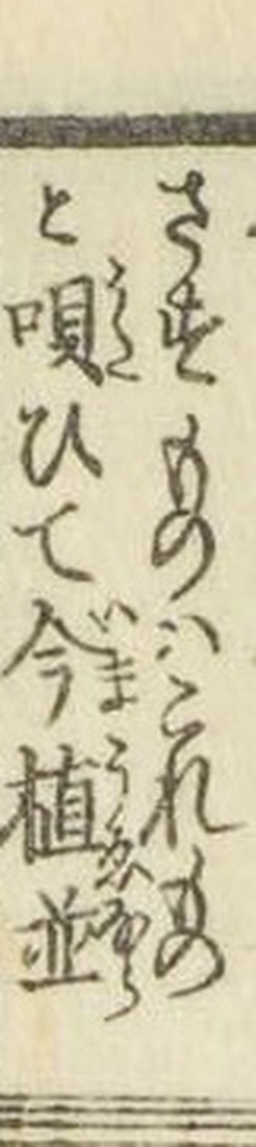と唄ひて今植並
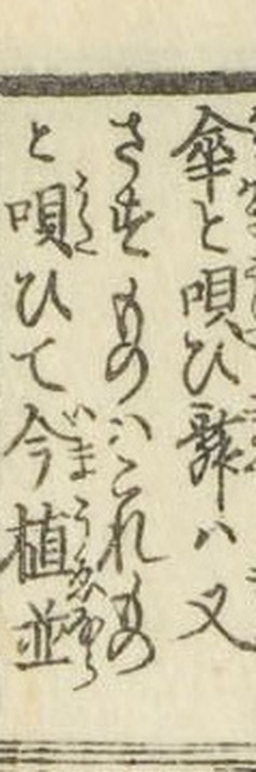さすものはこれもの
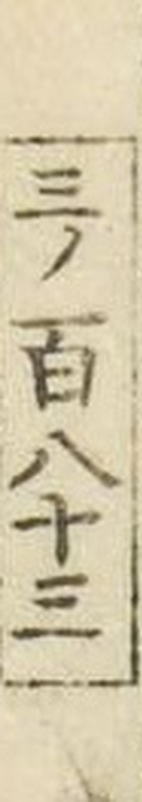三ノ百八十三
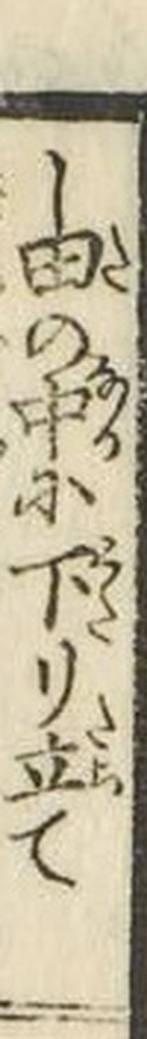し田の中に下り立て
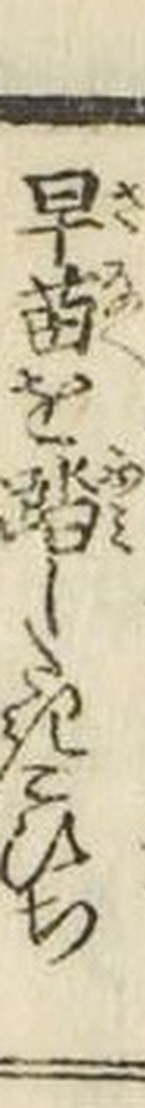早苗を踏したきこひち
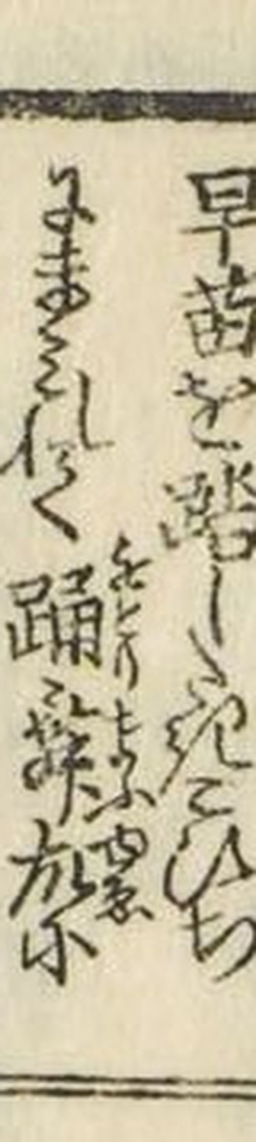にまみれて踊舞故に
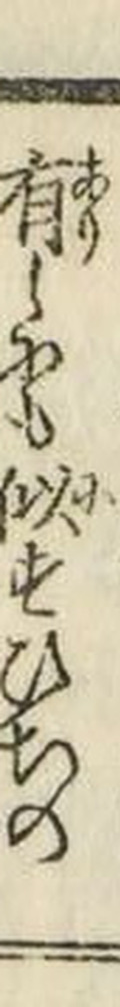有しにも似すひちの
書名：江戸名所図会 20巻 巻之10
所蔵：東京学芸大学教育コンテンツアーカイブ
